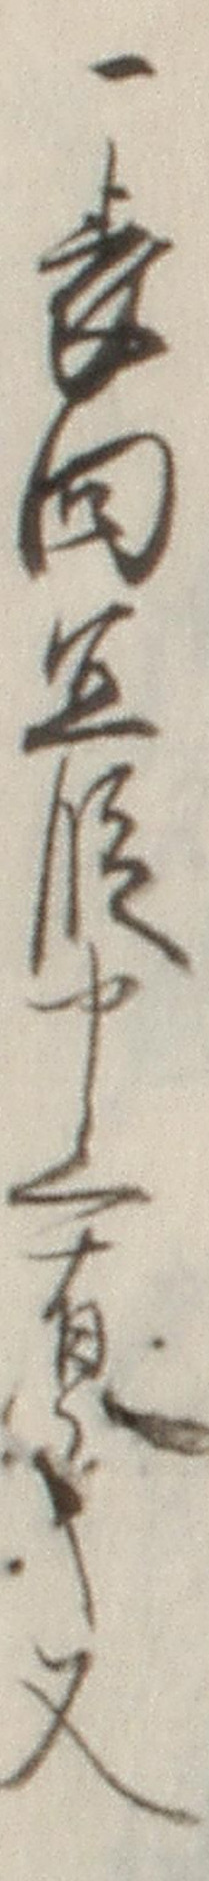一表向宜段申上有之又
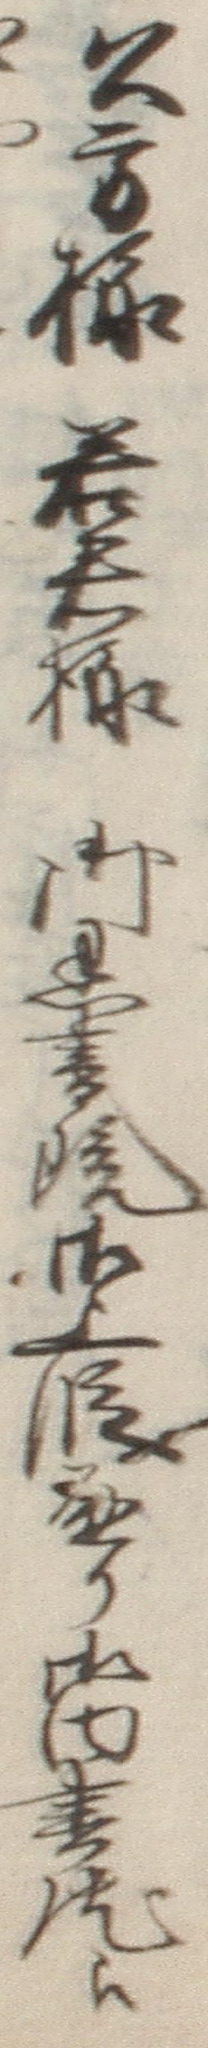公方様若君様御黒書院御上段通り御白書院え
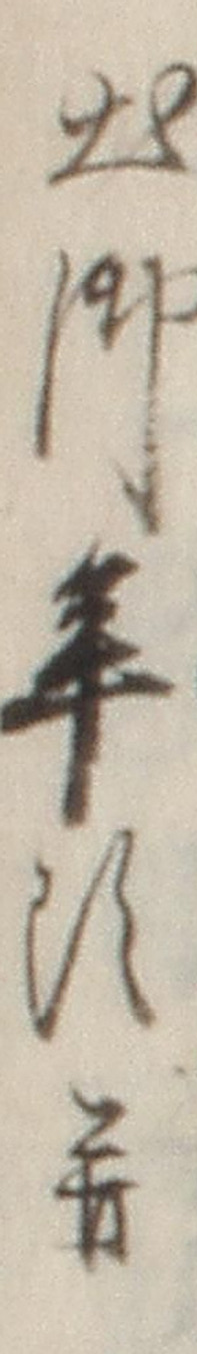出御年頭并

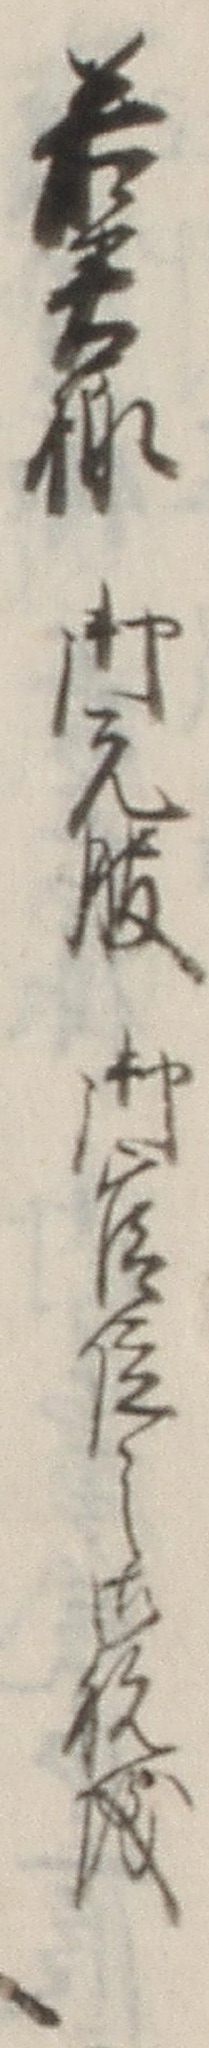若君様御元服御官位の御祝義
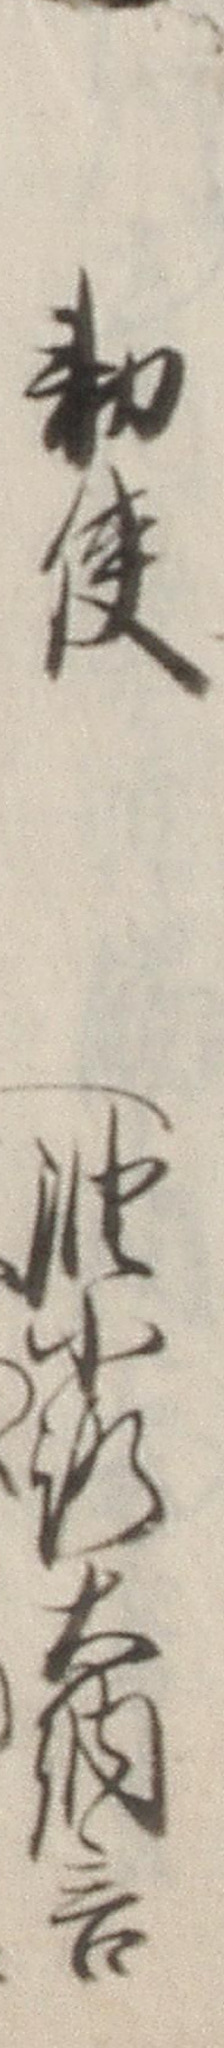勅使油小路大納言
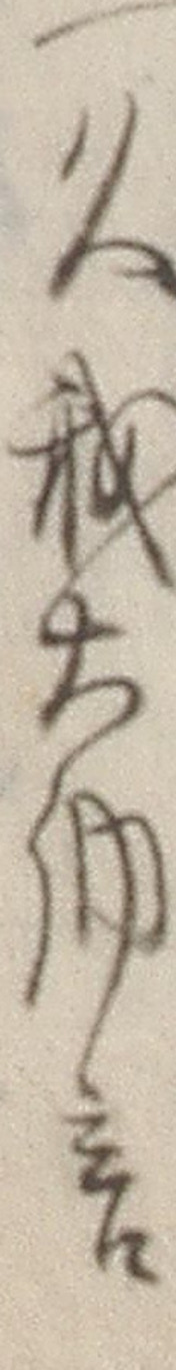久我大納言
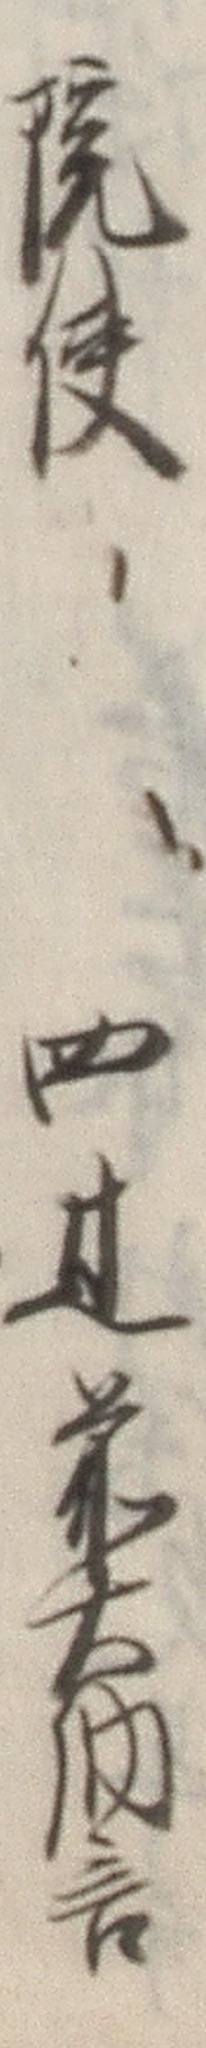院使四辻前大納言
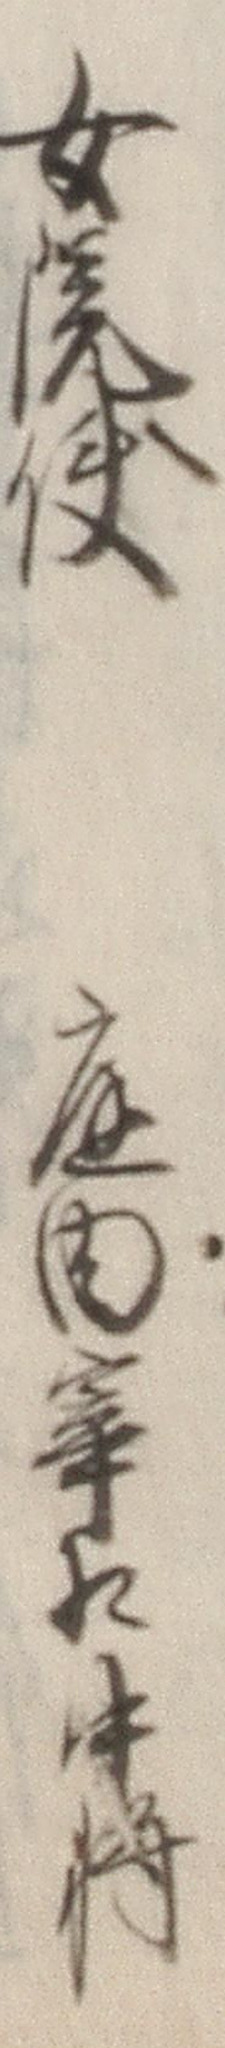女院使庭田宰相中将
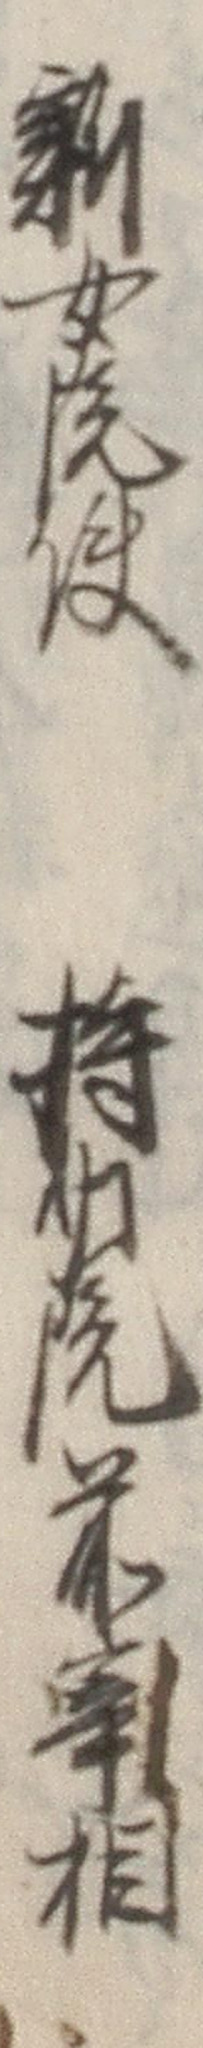新女院使持明院前宰相
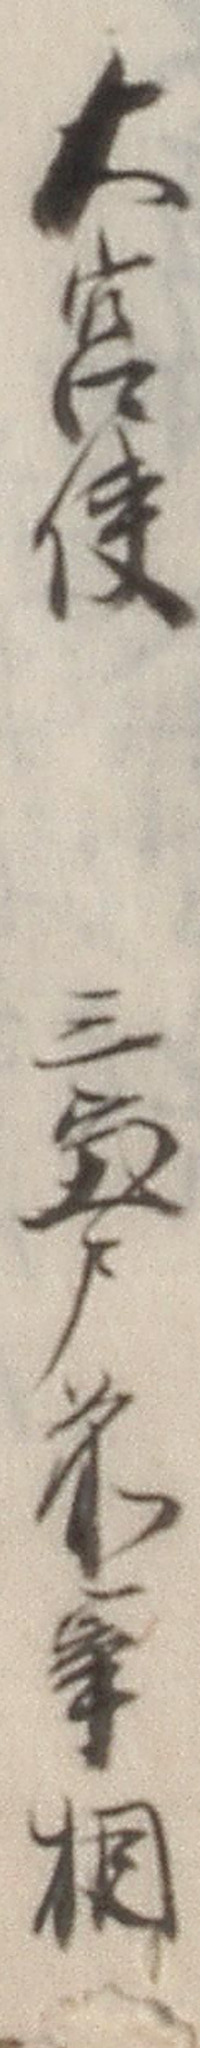大宮司三室戸前宰相
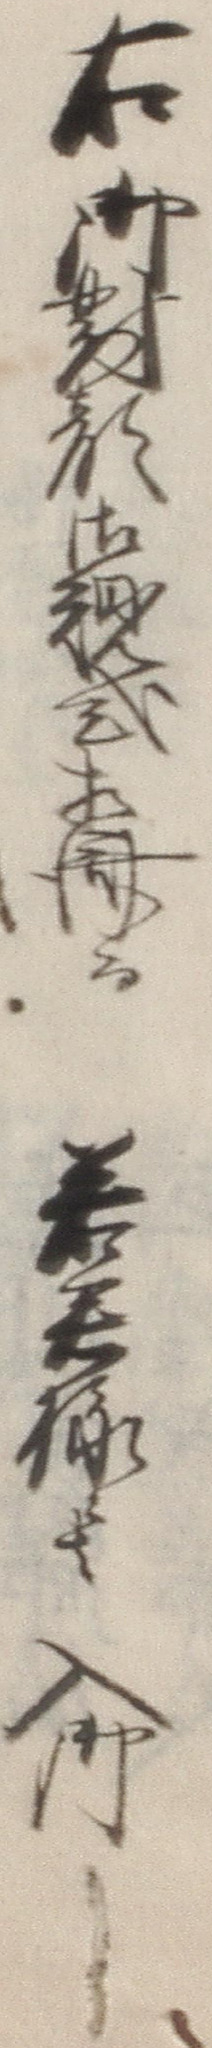右御対顔御規式相済而若君様は入御
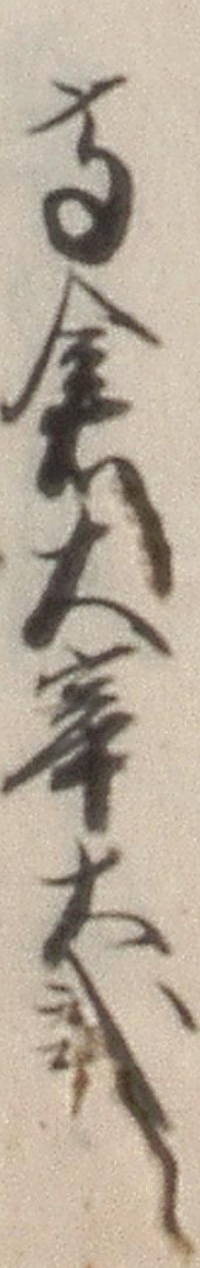高倉太宰大弐
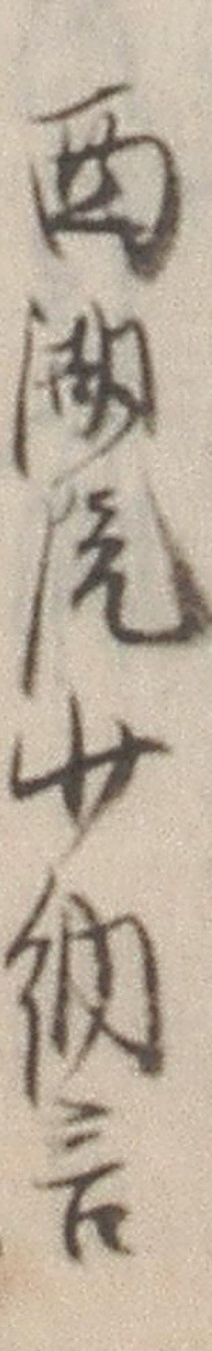西洞院少納言
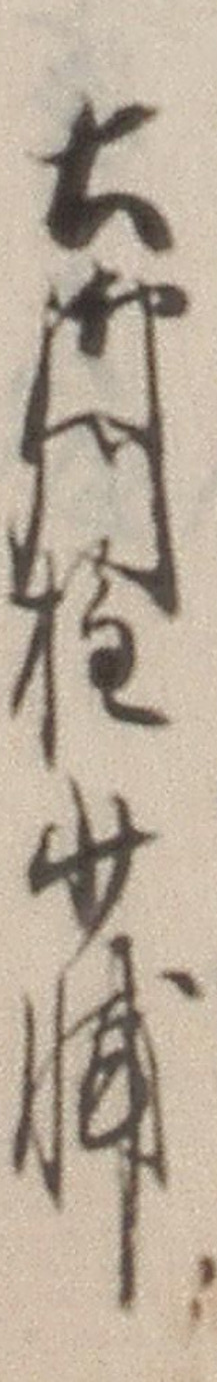大御門権少輔
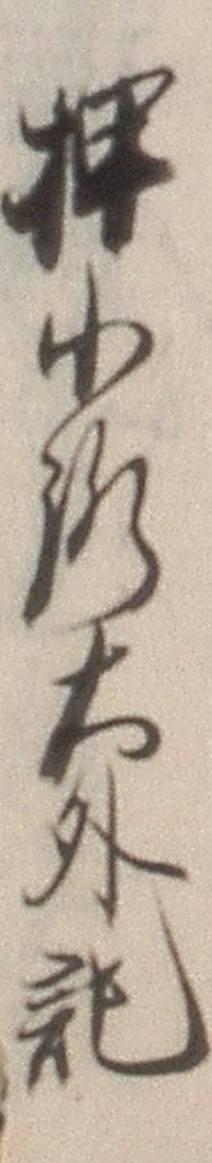押小路大外記
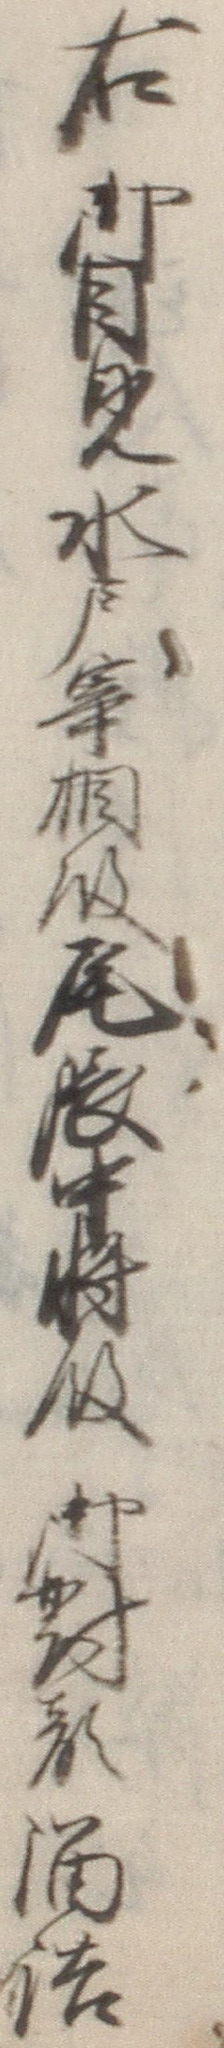右御目見水戸宰相殿尾張中将殿御対顔溜詰
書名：[諸国災害記録]
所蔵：東京大学地震研究所図書室 Earthquake Research Institute Library, The University of Tokyo, JAPAN
